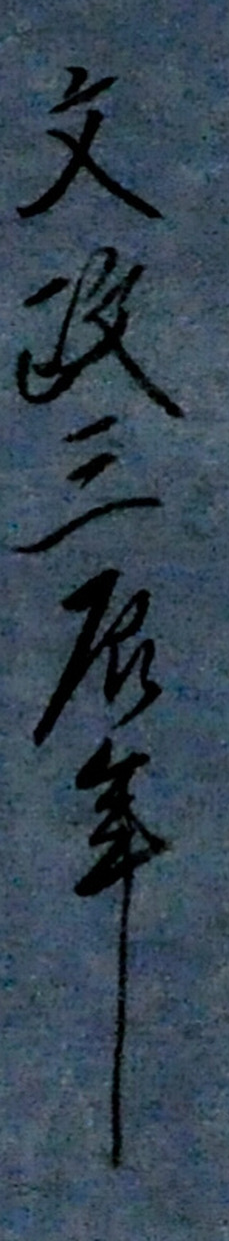文政三辰年
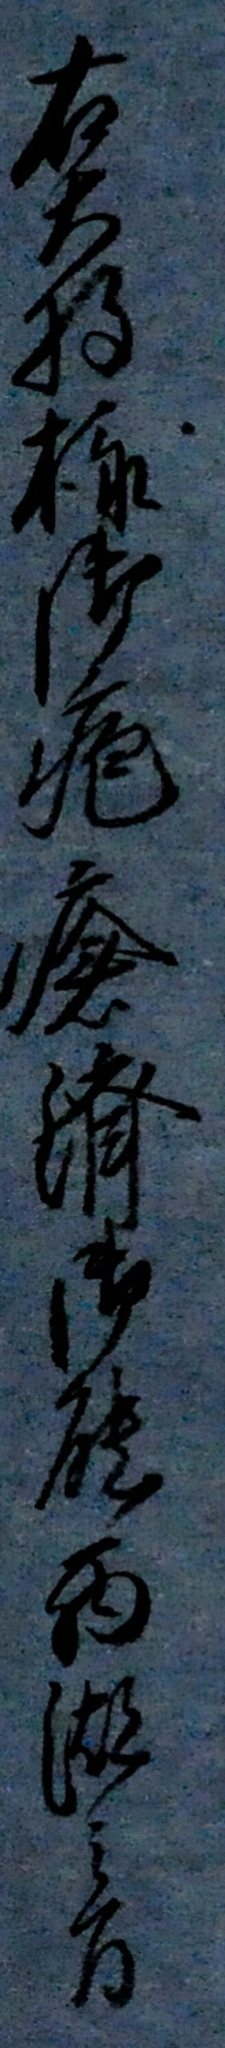右大将様御疱瘡済御能西湖之間
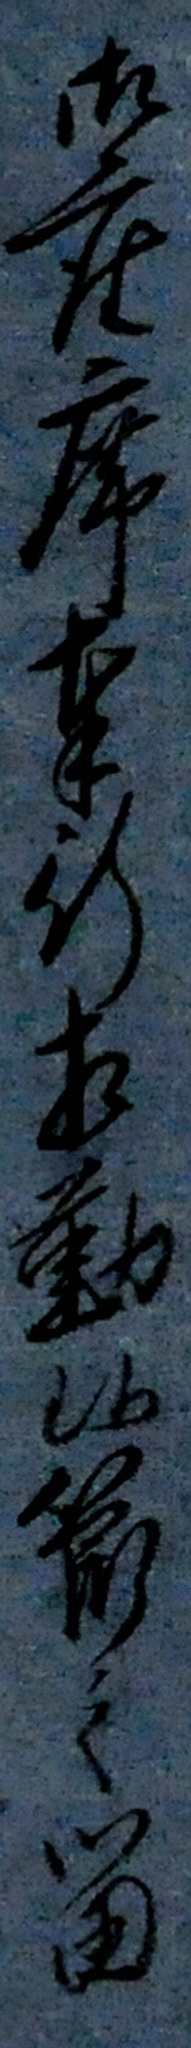御座席奉行相勤候節之留
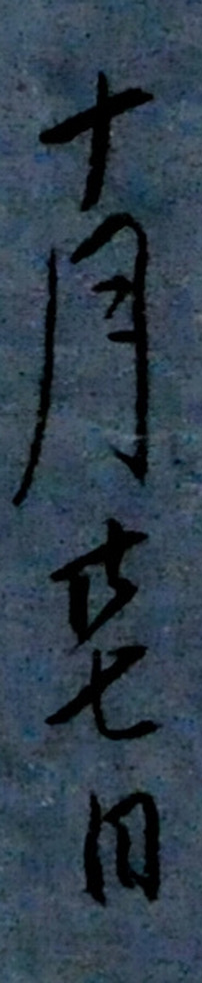十月廿七日
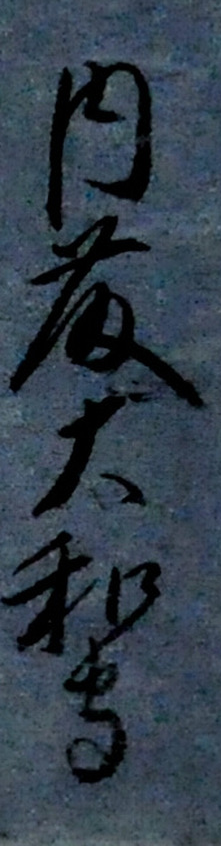内藤大和守

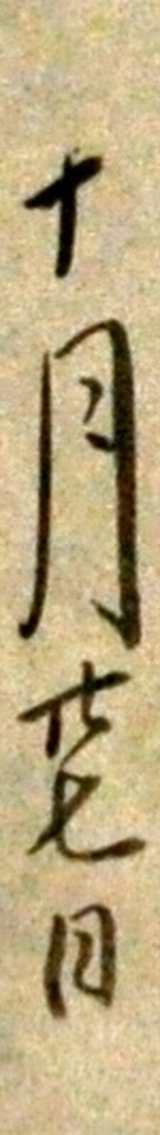十月廿七日
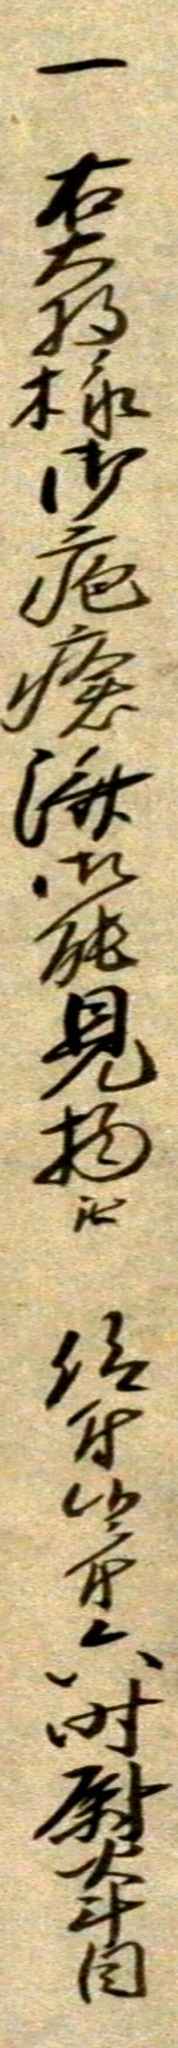一右大将様御疱瘡済御能見物被仰付候ニ付六時熨斗目
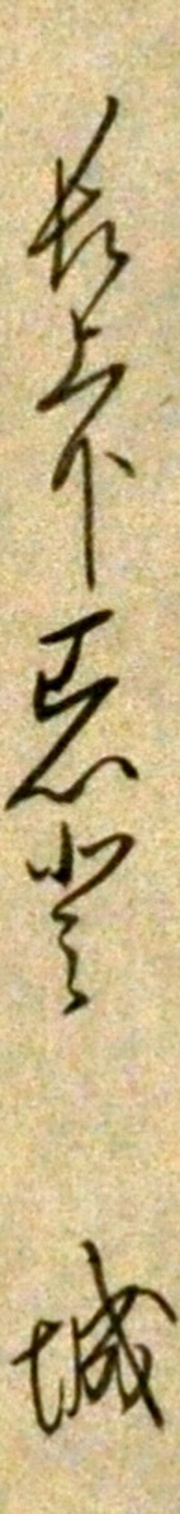長上下着登城
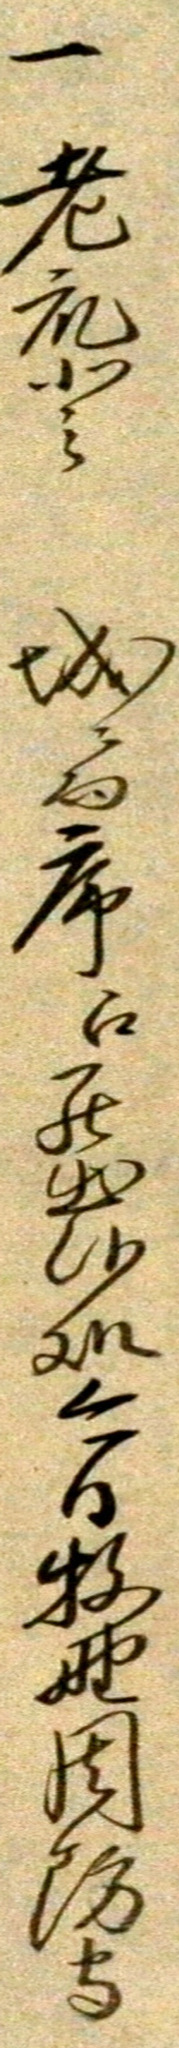一老衆登城ニ而席え罷出候処今日牧野周防守
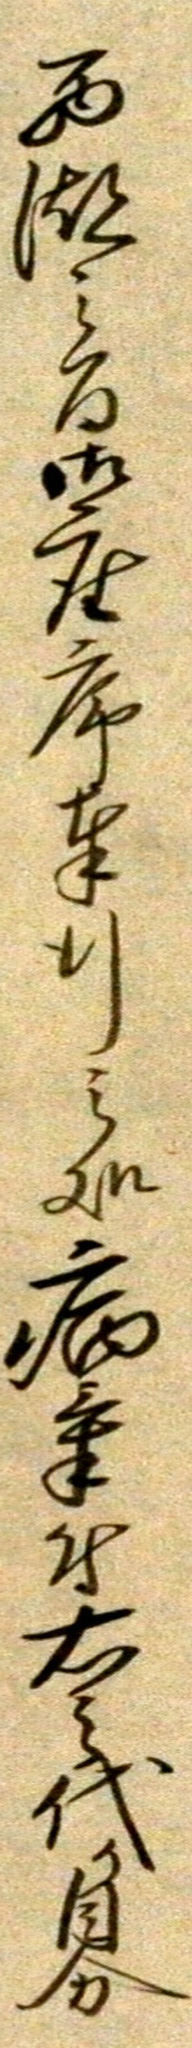西湖之間御座席奉行之処病気付右之代り自分
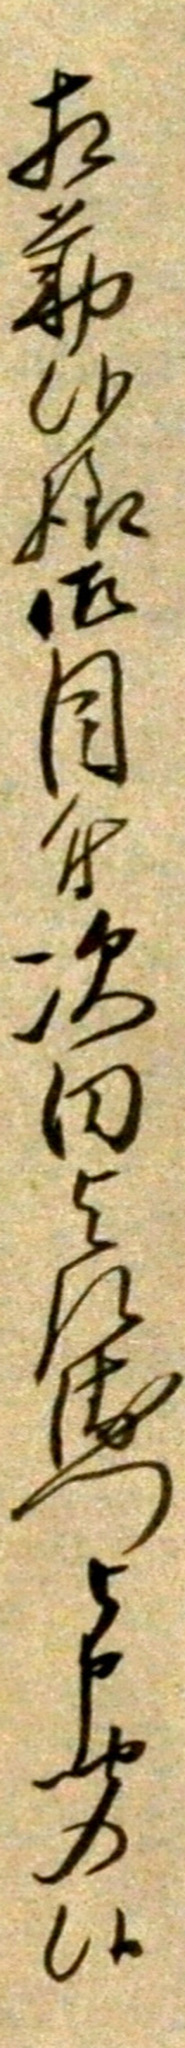相勤候様御目付次田与左衛門被申聞候
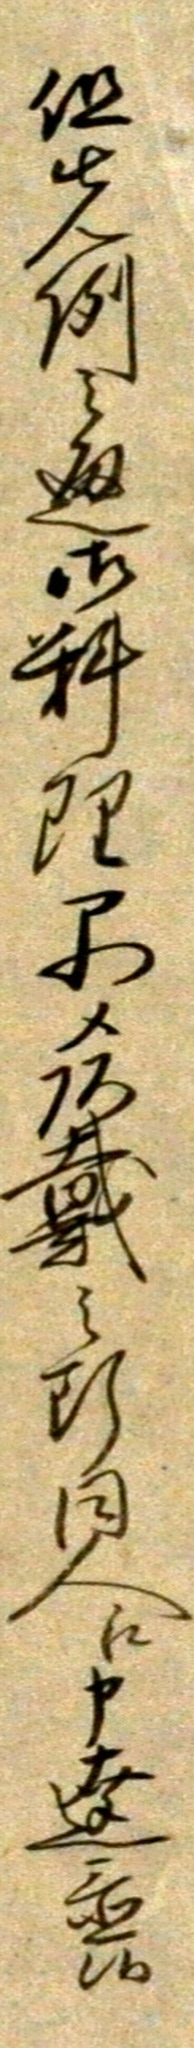但先例之通御料理早メ頂戴之断同人え申達置候
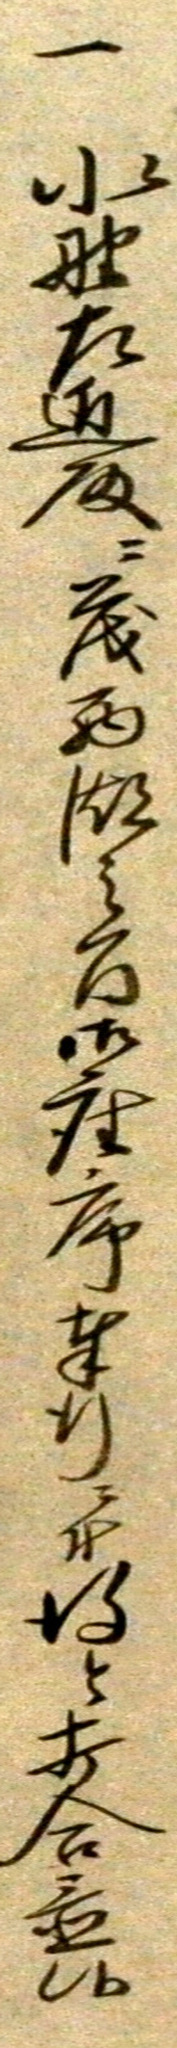一水野左近殿ニも西湖之間御座席奉行ニ付得と打合置候
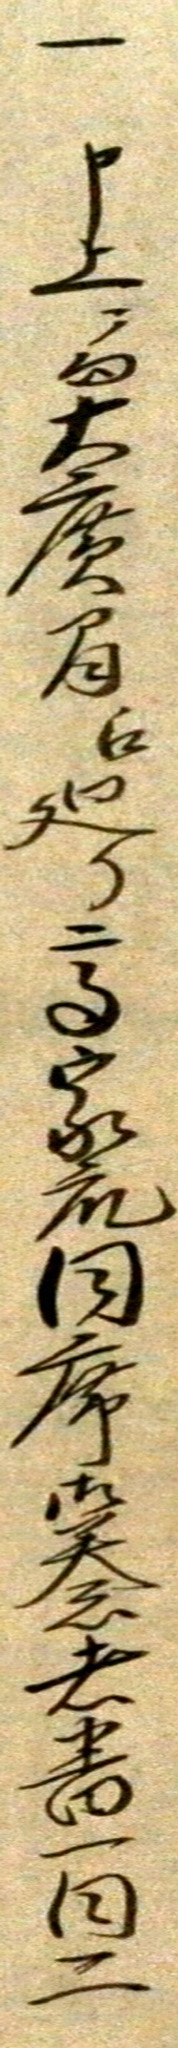一申上ニ而大広間え廻り高家衆同席御奏者番一同二
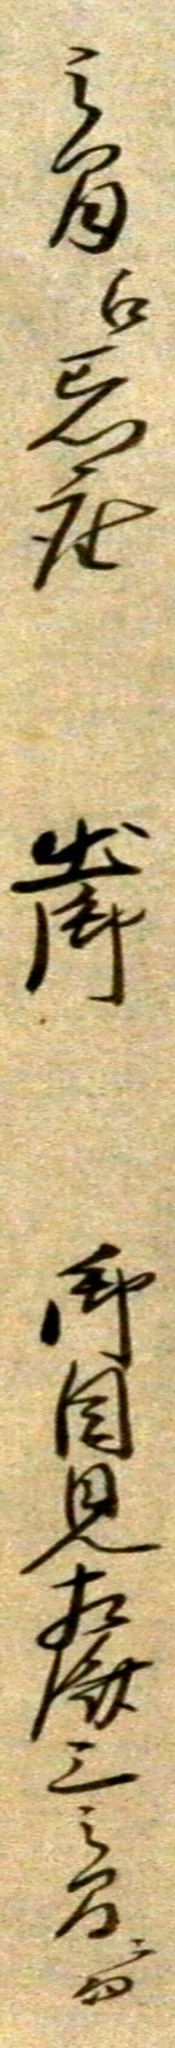之間え着座出御御目見相済三之間ニ而
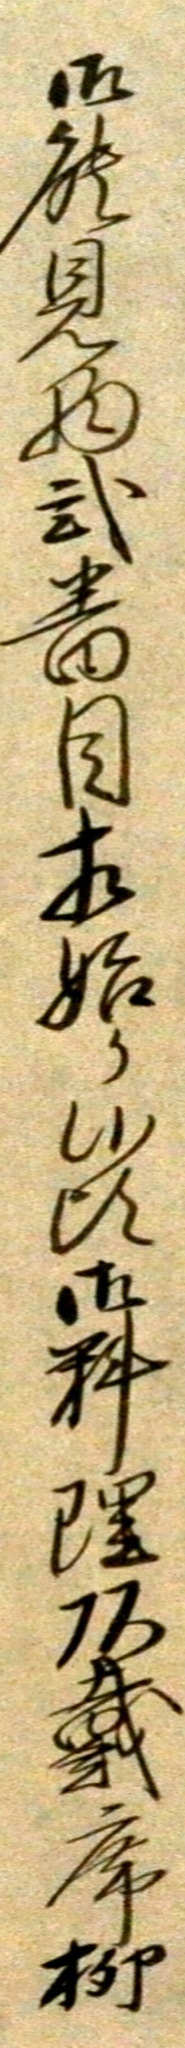御能見物弍番目相始り候頃御料理頂戴席柳
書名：右大将様御疱瘡済御能、西湖ノ間御座席奉行勤候節ノ留
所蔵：伊那市立高遠町図書館・合同会社AMANE
